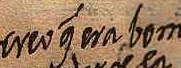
creo q̄ era bom
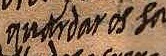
guardar os sa
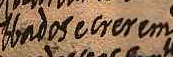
bbados e crer em
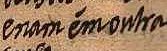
e nam em outra
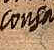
cousa
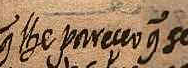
q̄ lhe pareçeo q̄ se
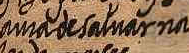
auia de saluar na
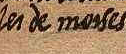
lei de moises
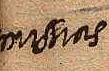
missias
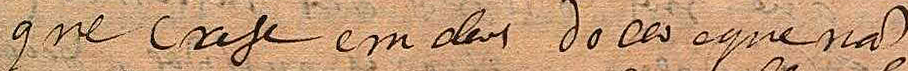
que crese em deos do ceo e que naõ
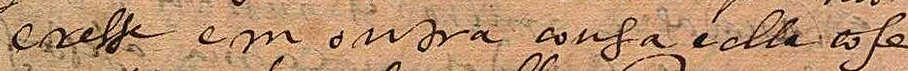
cresse em outra cousa e ella cōfe
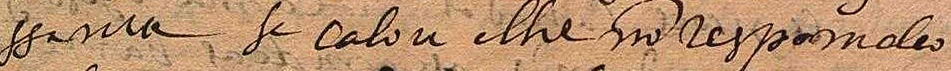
ssamte se calou e lhe nō respomdeo
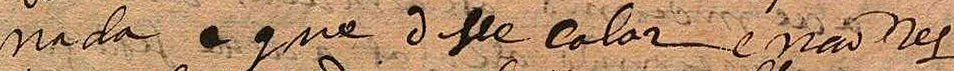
nada e que disse calar e naõ res
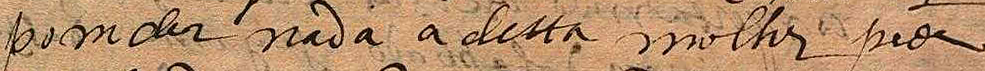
pomder nada a ditta molher pede
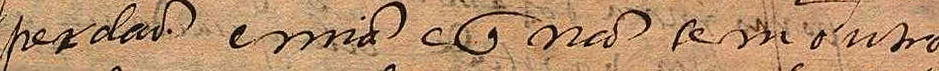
perdaõ e miā e q̄ naõ tem outra
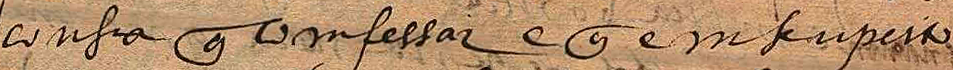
coussa q̄ comfessar e q̄ em seu peito
